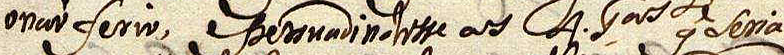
o naõ ferio, e persuadindosse as 4. Tas q̄ seria
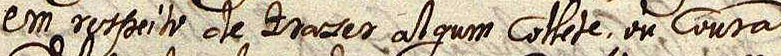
em respeito de trazer algum Collete, ou Coura
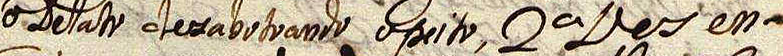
o Delato dezabotoando o peito, 2a Ves en
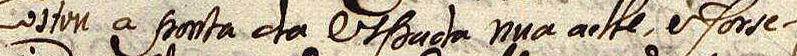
Costou a ponta da espada nua a elle, e forse
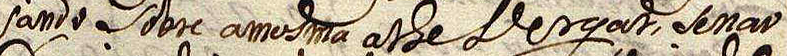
jando sobre a mesma athe Vergar, se naõ
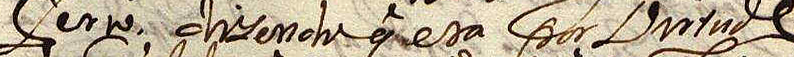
ferio, dizendo q̄ era por Virtude
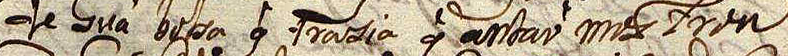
de huā bolsa q̄ trazia q̄ antaõ mostrou
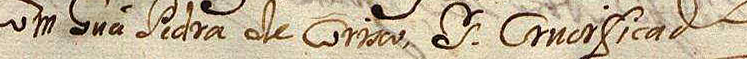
Com huā Pedra de Corisco, S.r Crucificado
